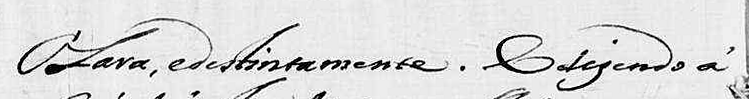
Clara, e destintamente. E dizendo á
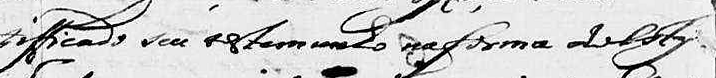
tificado seu testemunho na forma do esty
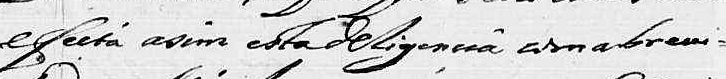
e feita asim esta deligencia com a breui
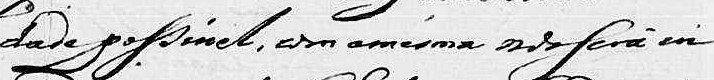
dade possiuel, com a mesma nos será in
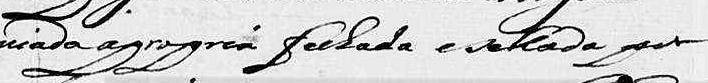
uiada a propria fechada e sellada por
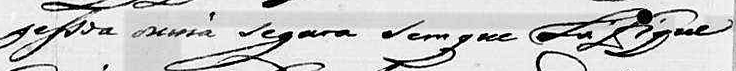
pessoa onrosa segura sem que La fique
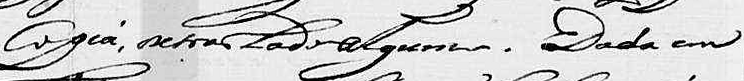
Copia, ou trasLado algum. Dada em
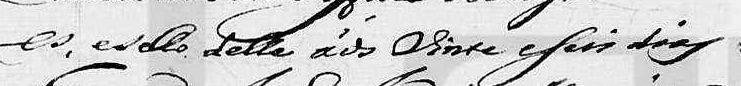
es, e sello delle aos Vinte e seis dias
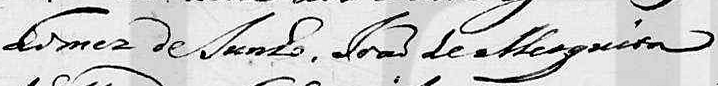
do mez de Iunho. Ioaõ de Mesquita
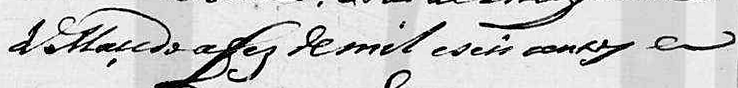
de Macedo a fez de mil e seiscentos e
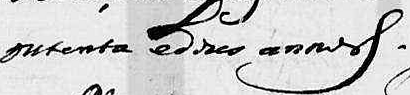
outenta e dous annos.
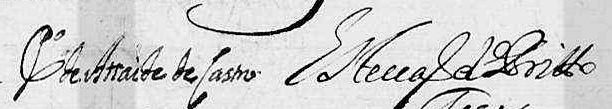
Po de Attaide de Castro ESteuaõ de Britto
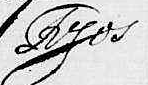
Foyos
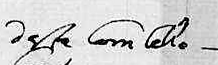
desta Com Cello
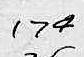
174
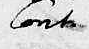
Conta
